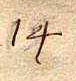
14
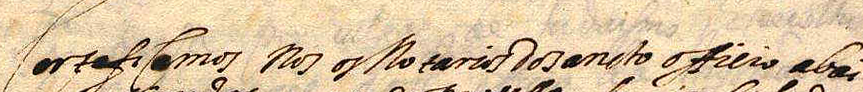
CertefiCamos Nos os notarios do sancto officio abai
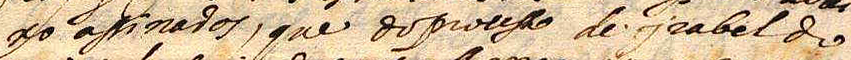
xo assinados, que do processo de jzabel do
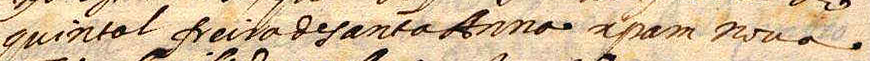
quintal freira de santa Anna xpam noua
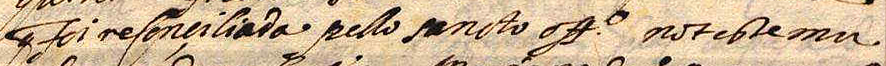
q̄ foi reConciliada pello sancto off.o no testemu
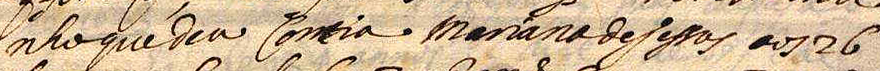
nho que deu Contra mariana de jessus aos 26
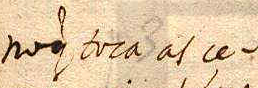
no q̄ toca as ce
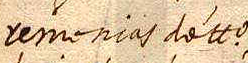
remonias do tto.
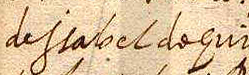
de jsabel do quī
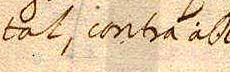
tal, contra a R.
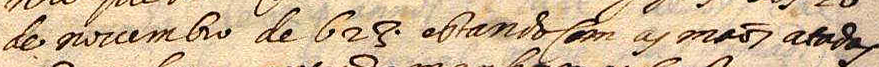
de nouembro de 623. estando Com as maõs atadas
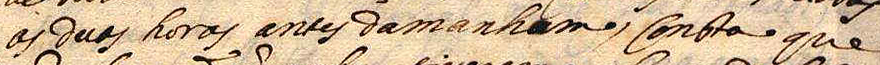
as duas horas antes da manham, Consta que
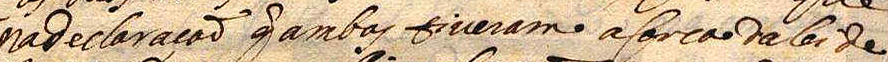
na declaraçaõ q̄ ambas tiueram aCerca da lei de
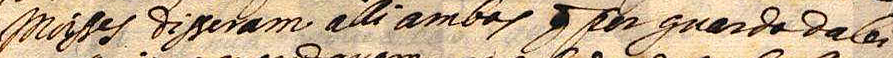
Moisses disseram alli ambas q̄ por guarda da lei
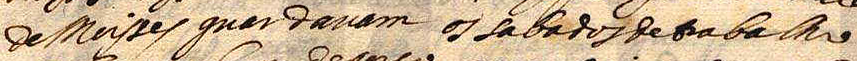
de Moisses guardauam os sabados de trabalho
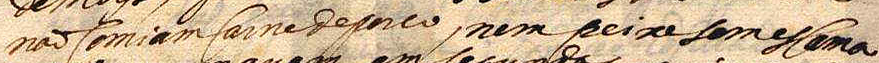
naõ Comiam Carne de porco, nem peixe sem esCama
